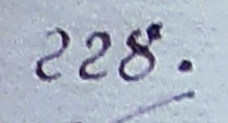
228.
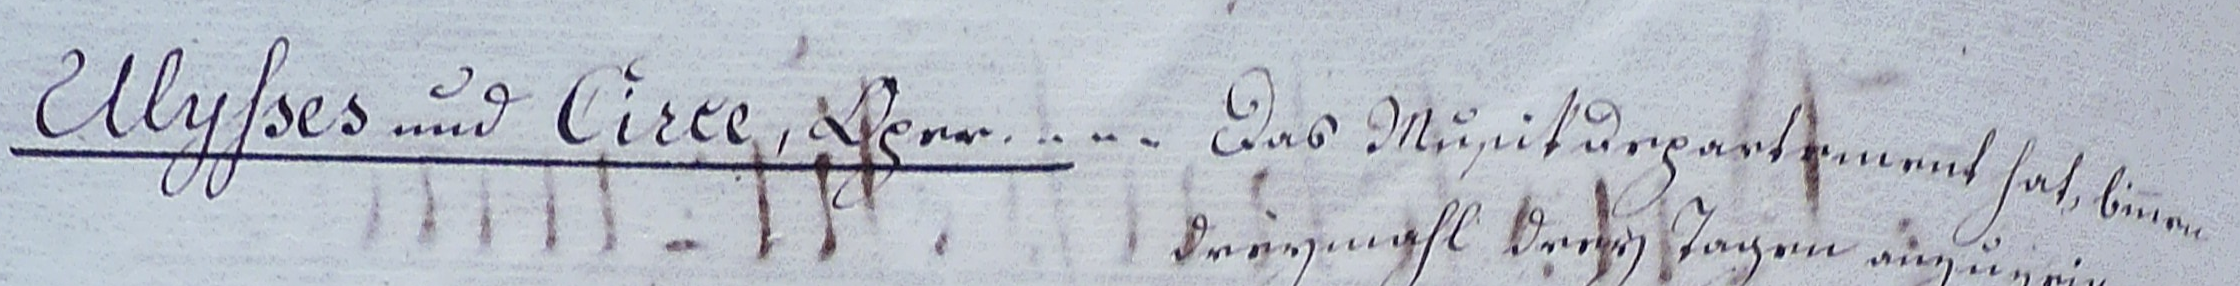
Ulysses und Circa, Oper. .. .. .. Das Musikdepartement hat, bin̅en
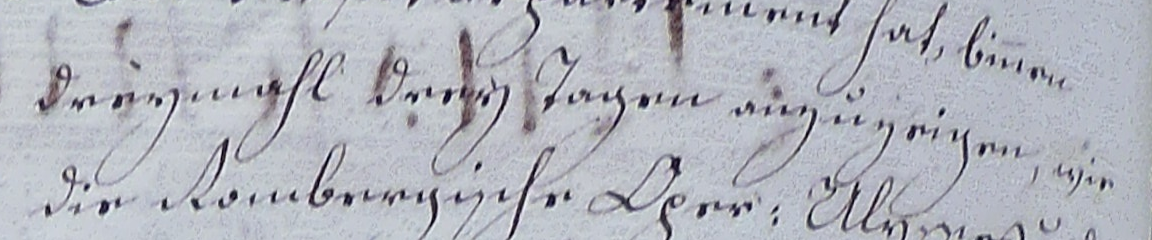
dreymahl drey Tagen anzuzeigen, wie
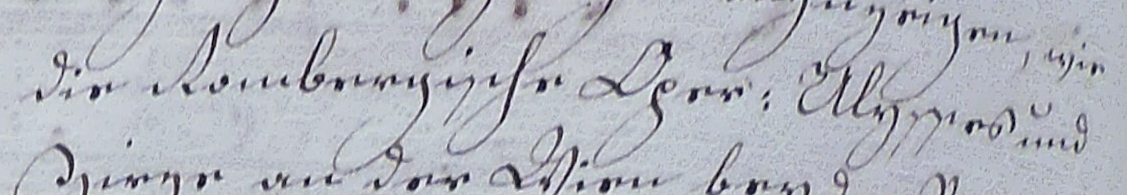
die Rombergische Oper: Ulyses und
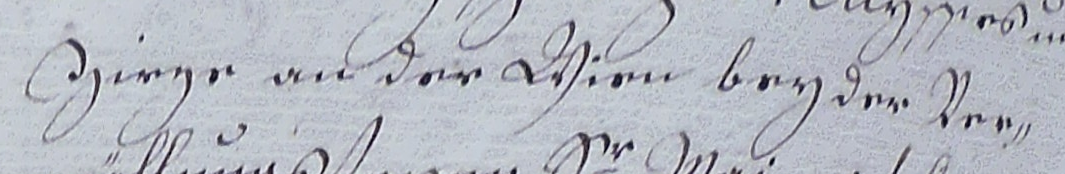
Zirze an der Wien bey der Ver¬
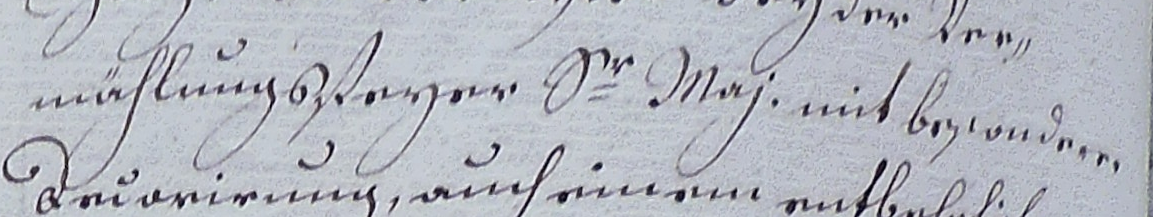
mählungsfeyer Sr͇ Maj. mit besonderer
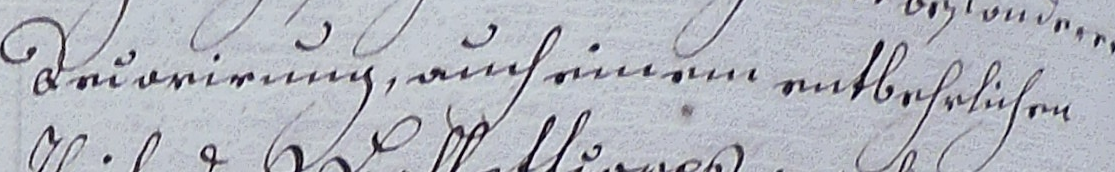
Decorirung, auch einem entbehrlichen
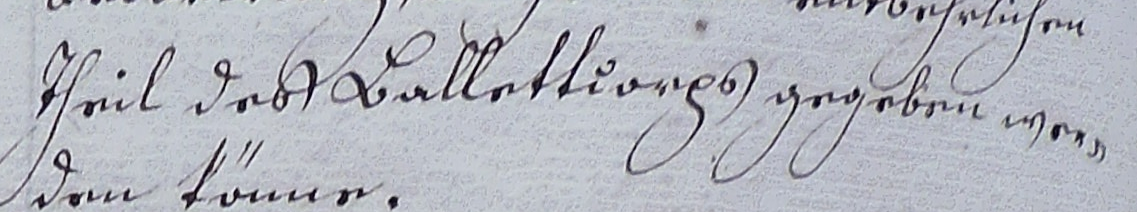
Theil des Ballettcorps gegeben wer¬
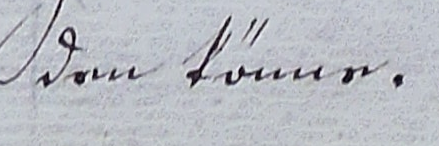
den könne.
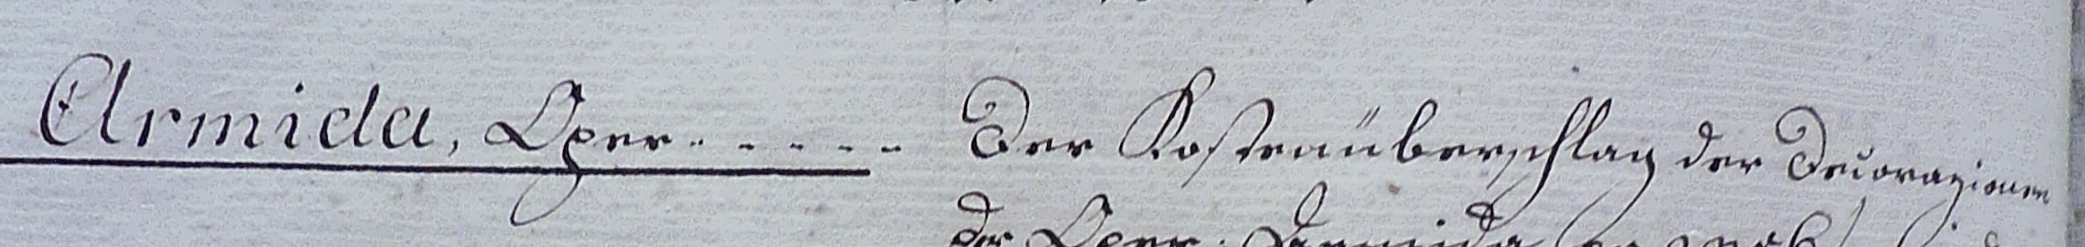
Armida, Oper .. .. .. .. .. Der Kostenüberschlag der Decorazionen
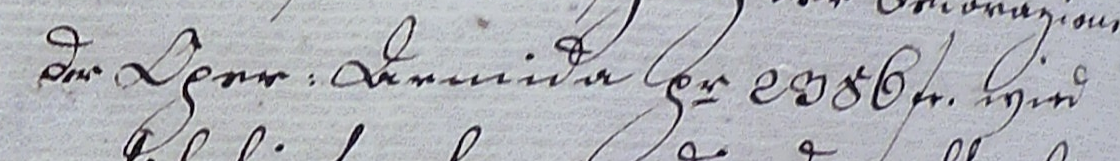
der Oper: Armida pr͇ 2386fr. wird
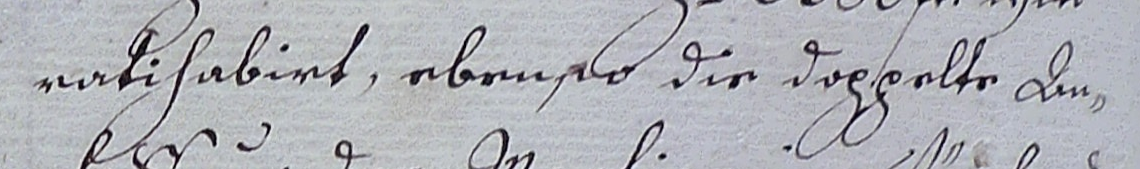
ratihabirt, ebenso die doppelte An¬
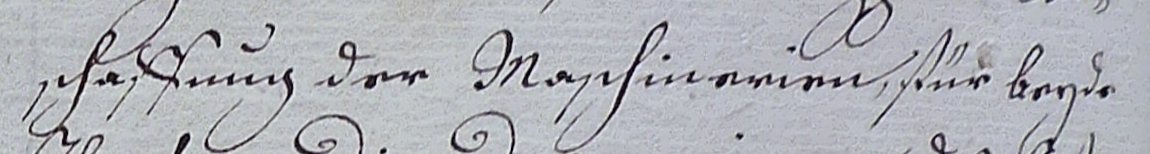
schaffung der Maschinerien für beyde
